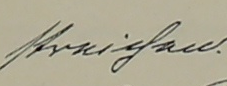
streichen.
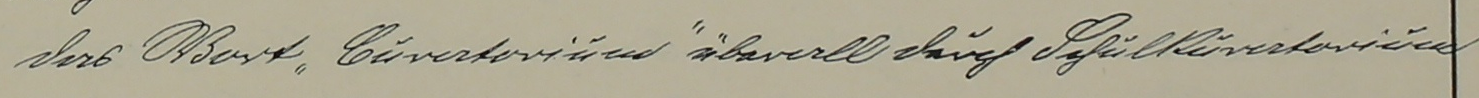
das Wort „Curatorium“ überall durch Schulkuratorium
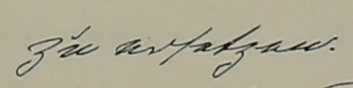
zu ersetzen.
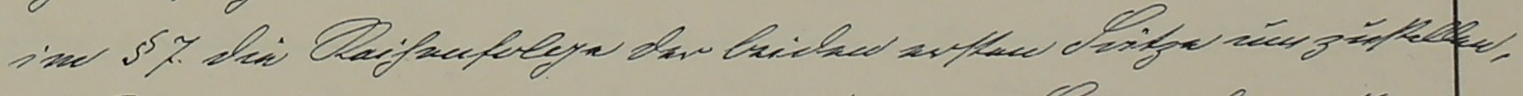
im § 7. die Reihenfolge der beiden ersten Sätze umzustellen,
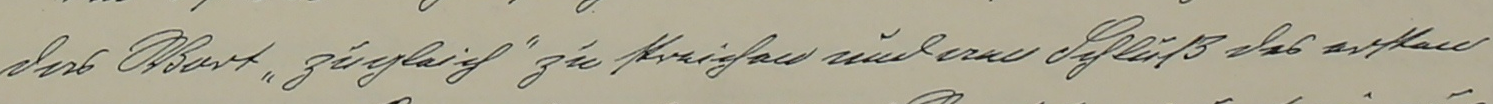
das Wort „zugleich“ zu streichen und am Schluß des ersten
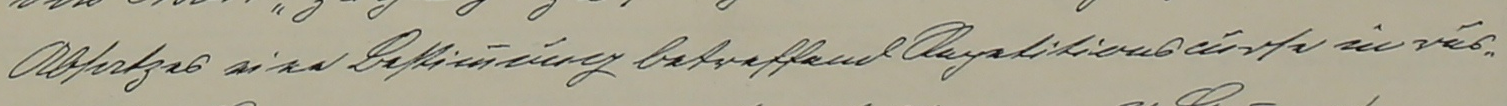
Absatzes eine Bestimmung betreffend Repetitionscurse in rus-
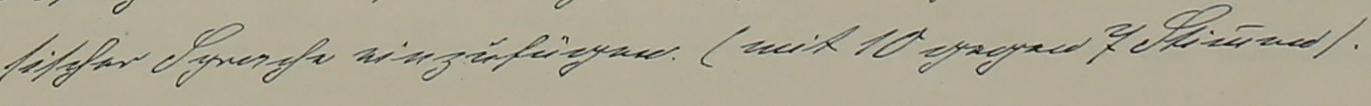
sischer Sprache einzufügen. (mit 10 gegen 7 Stimmen).
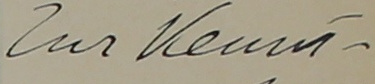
Zur Kennt
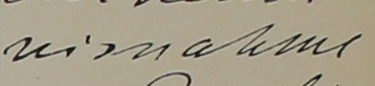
nisnahme
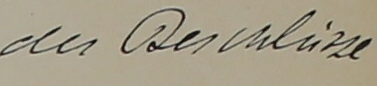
der Beschlüsse
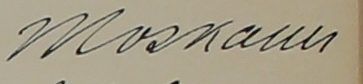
Moskauer
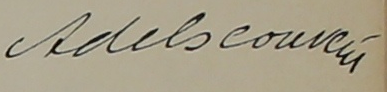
Adelsconvent
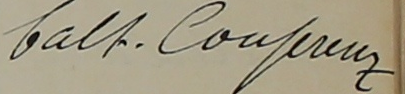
balt. Conferenz
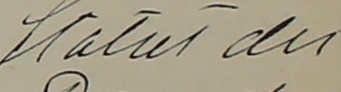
Statut der
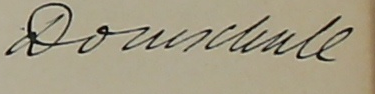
Domschule
